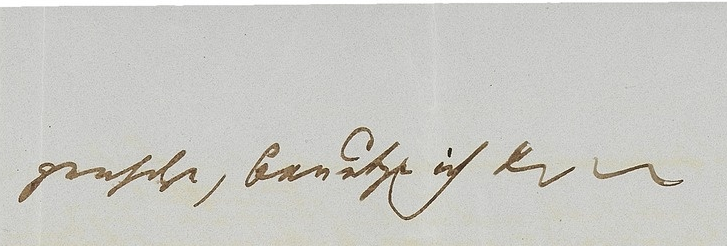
sehe, benutze ich ~~
